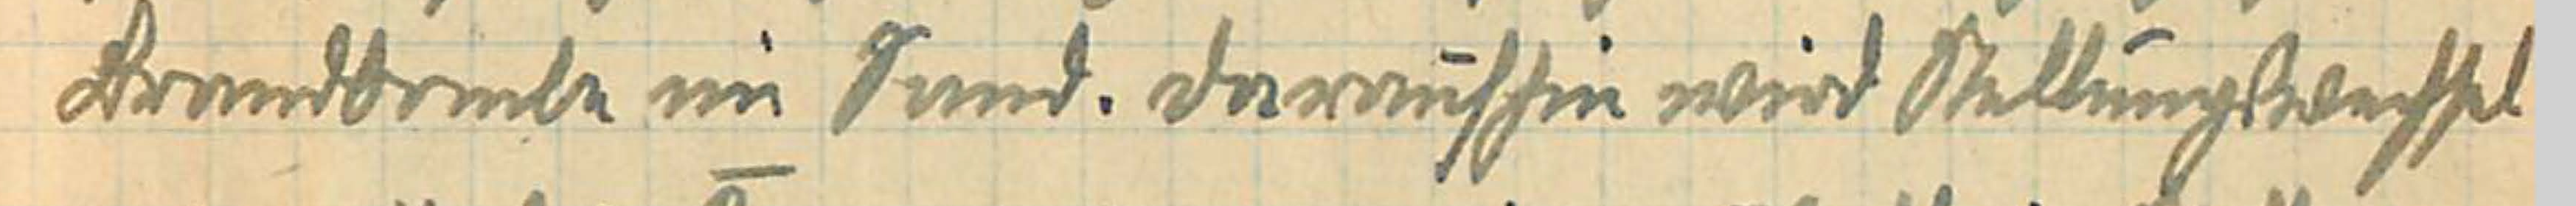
Brandbombe im Sand. Daraufhin wird Stellungswechsel
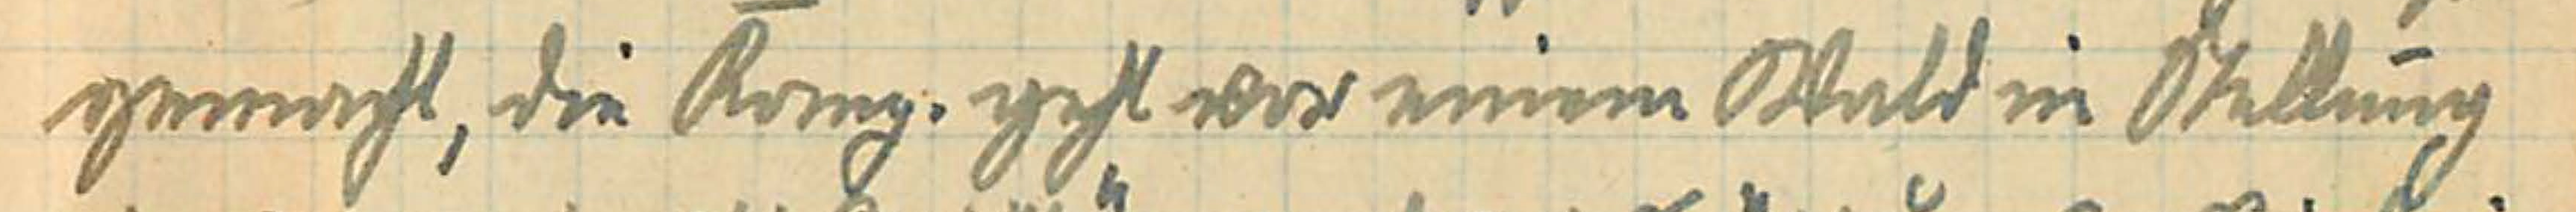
gemacht, die Komp. geht vor einem Wald in Stellung
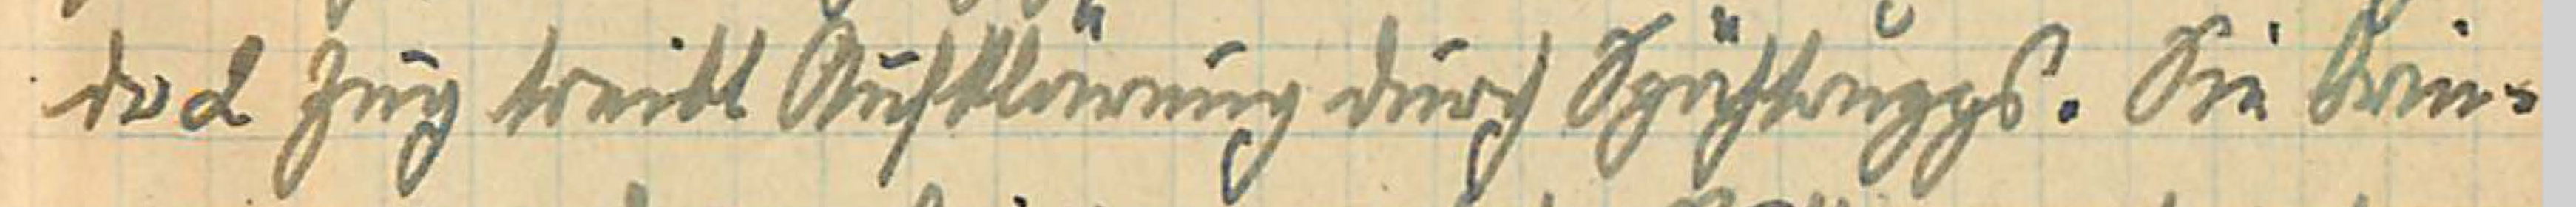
der 2 Zug treibt Aufklärung durch Spähtrupps. Sie brin-
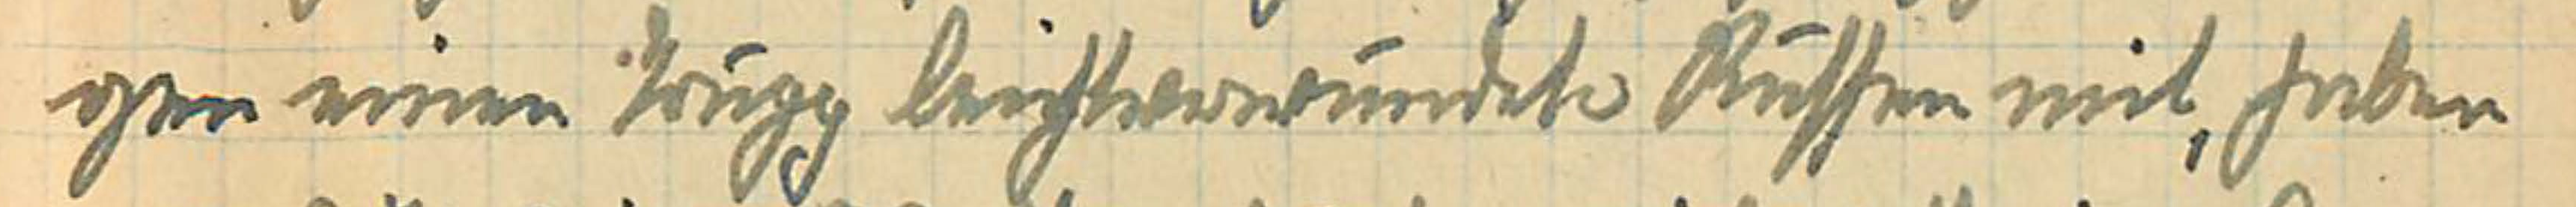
gen einen Trupp leichtverwundeter Russen mit, haben
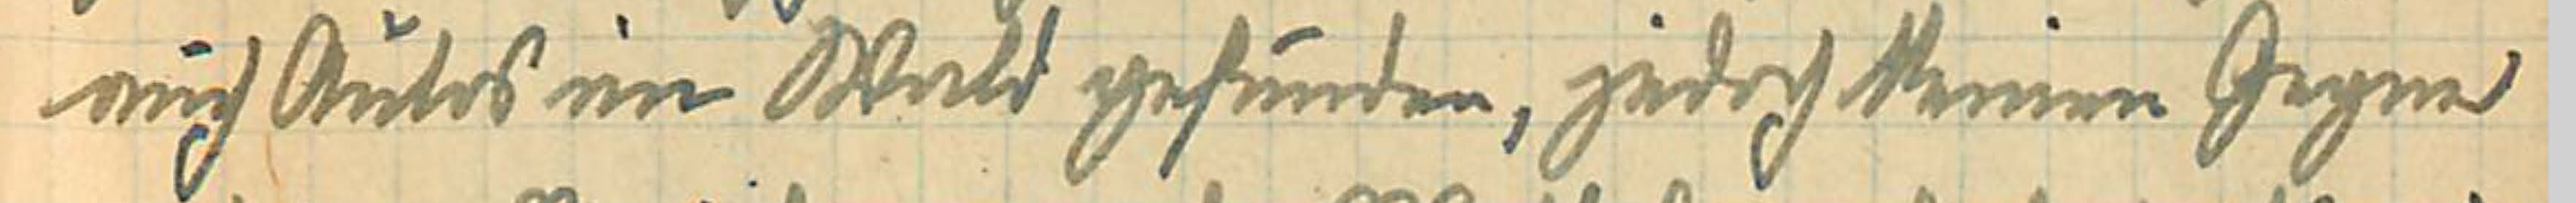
auch Autos im Wald gefunden, jedoch keinen Gegner
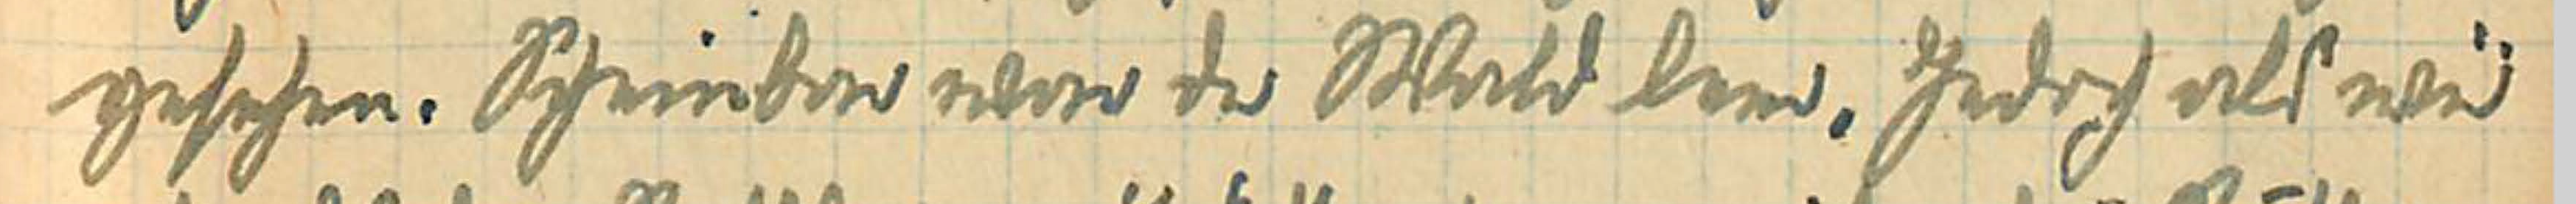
gesehen. Scheinbar war der Wald leer. Jedoch als wir
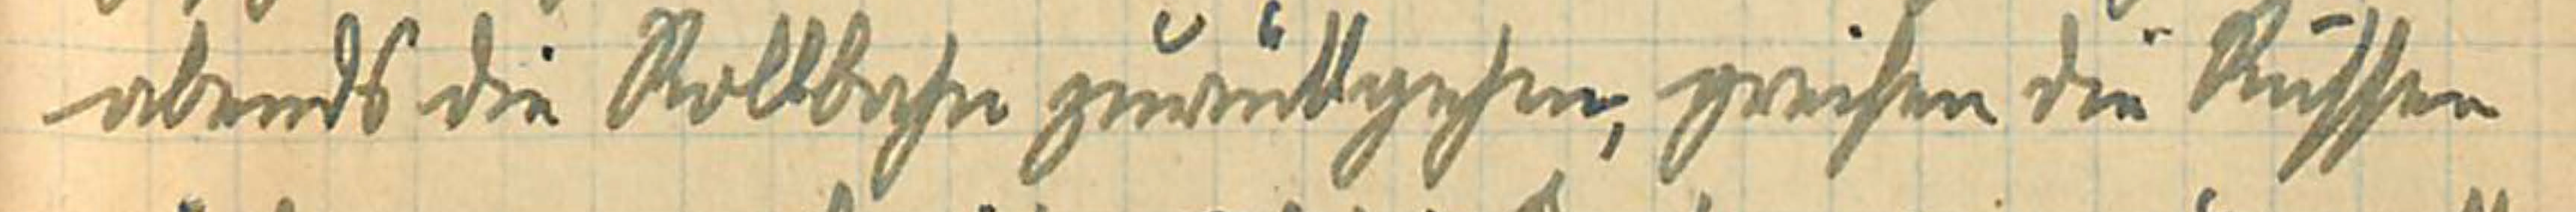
abends die Rollbahn zurückgehen, greifen die Russen
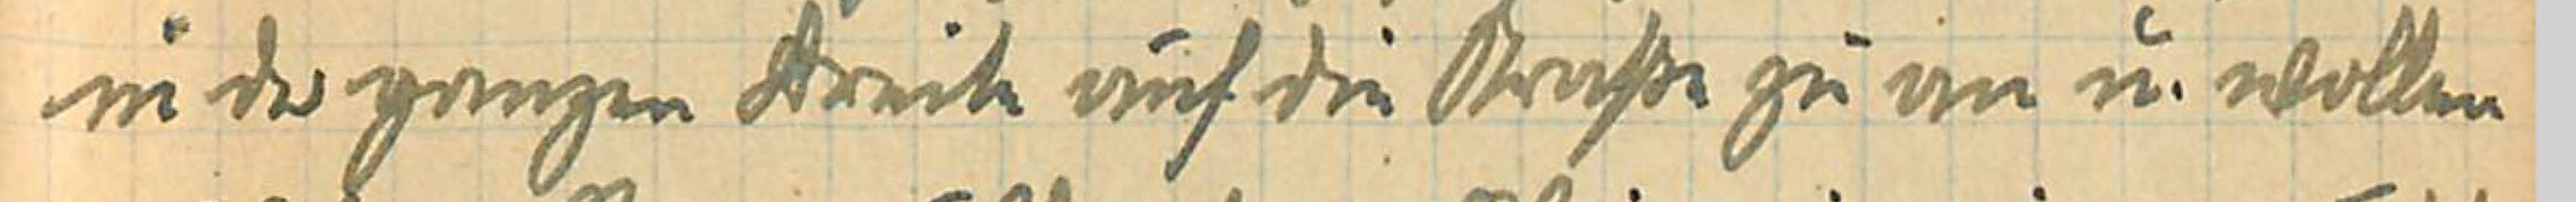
in der ganzen Breite auf die Straße zu an u. wollen
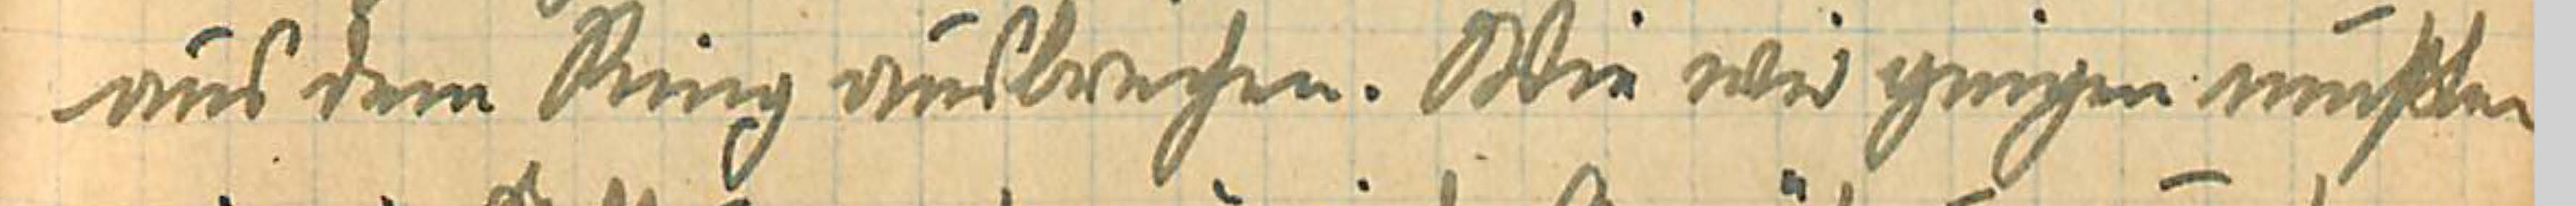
aus dem Ring ausbrechen. Wie wir gingen mußten
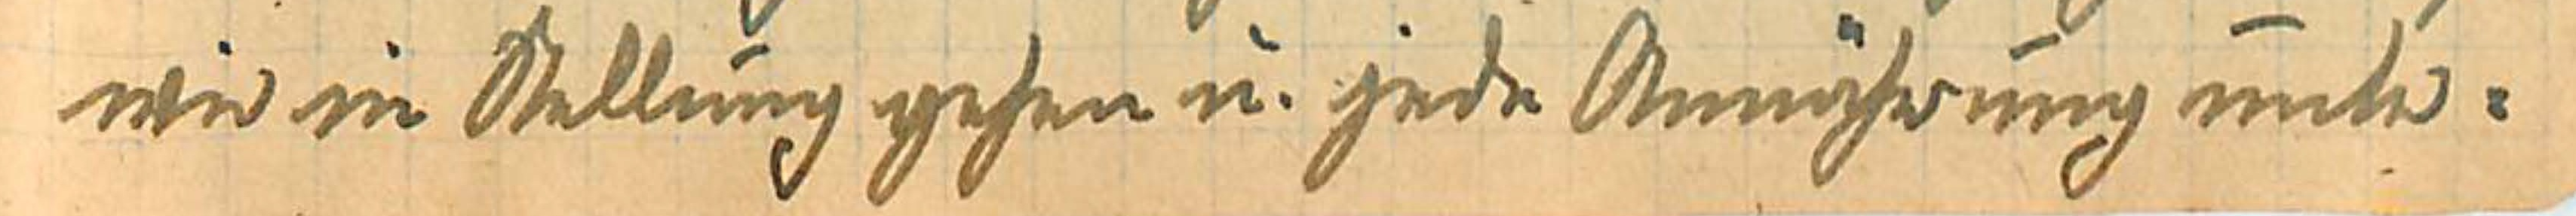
wir in Stellung gehen u. jede Annäherung unter-
